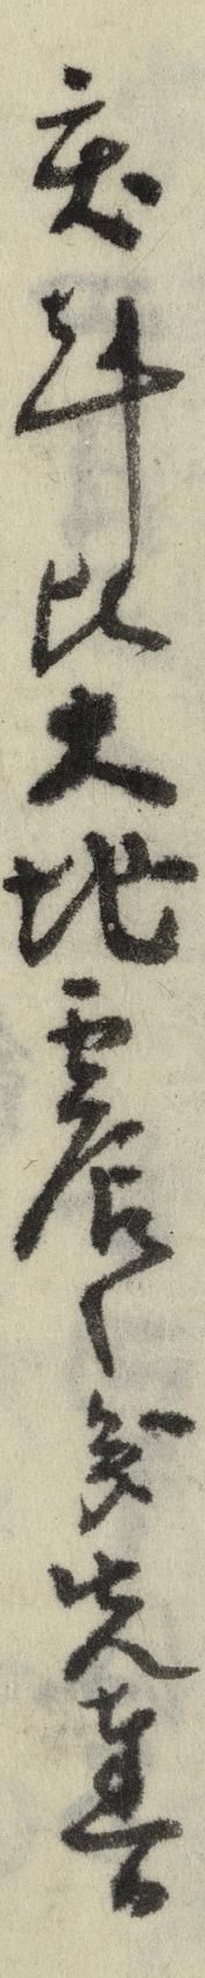亥刻比大地震之義先達而
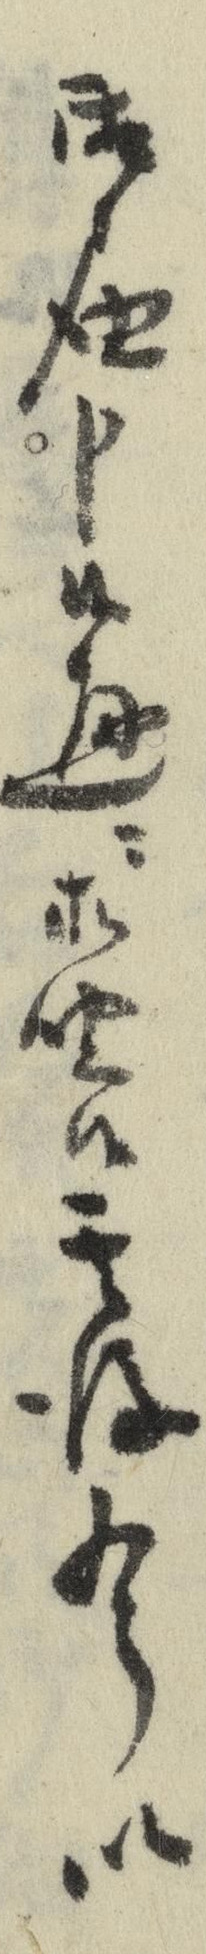御届申候通二御坐候其後今以

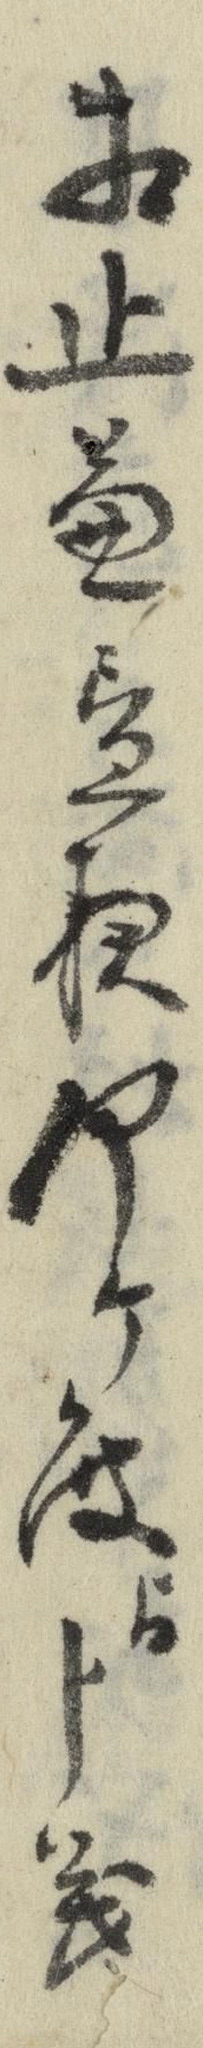相止兼昼夜何ヶ度と申義
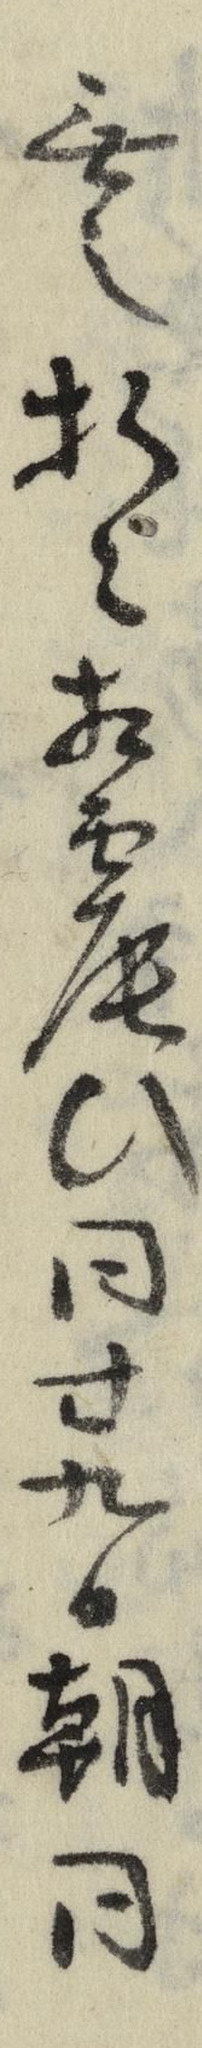無之折々相震ひ同廿九日朝同
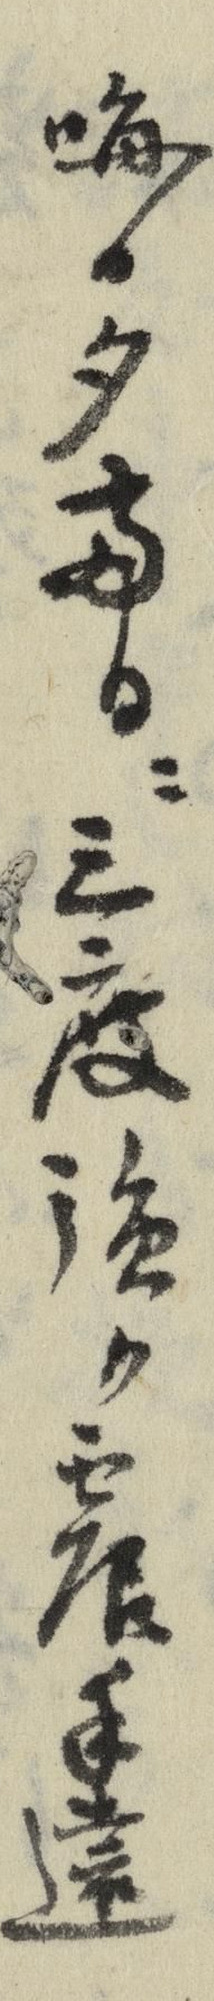晦日夕両日ニ三度強ク震手遠
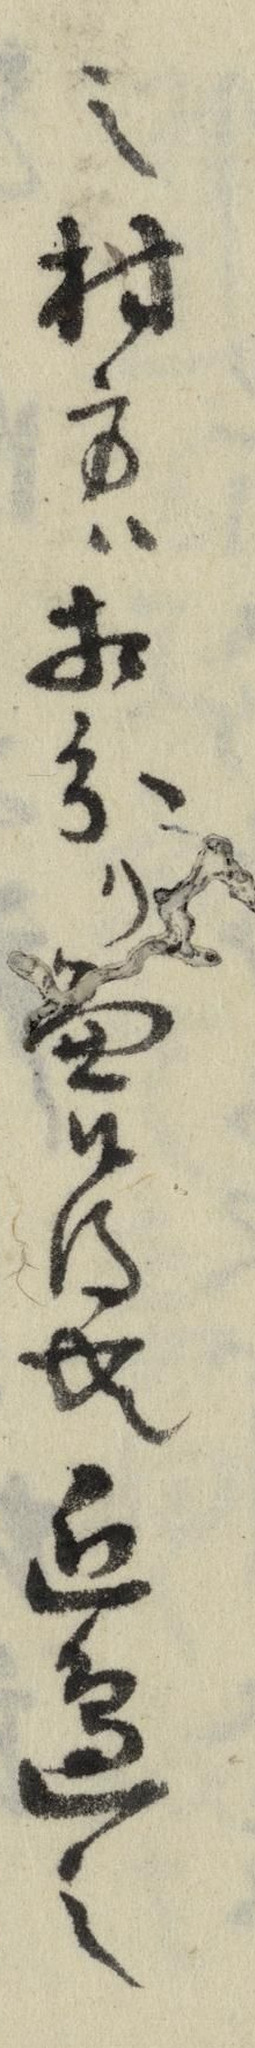之村方ハ相分兼候得共近辺之
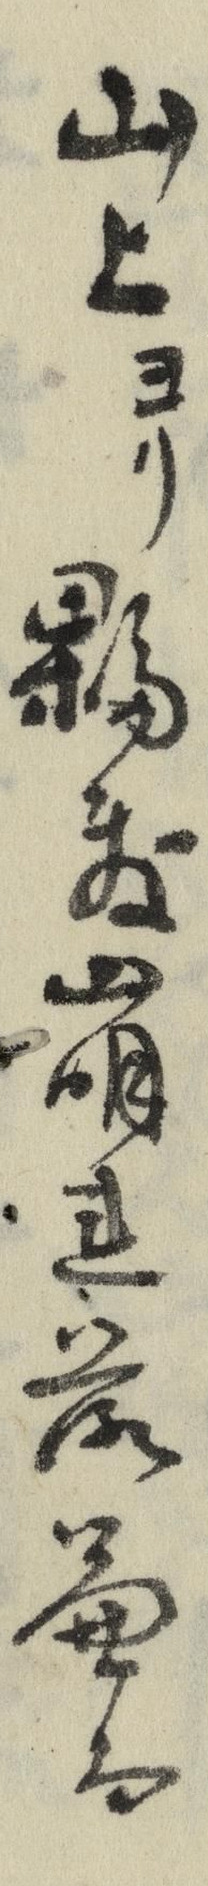山上ヨリ夥敷崩れ落兼而
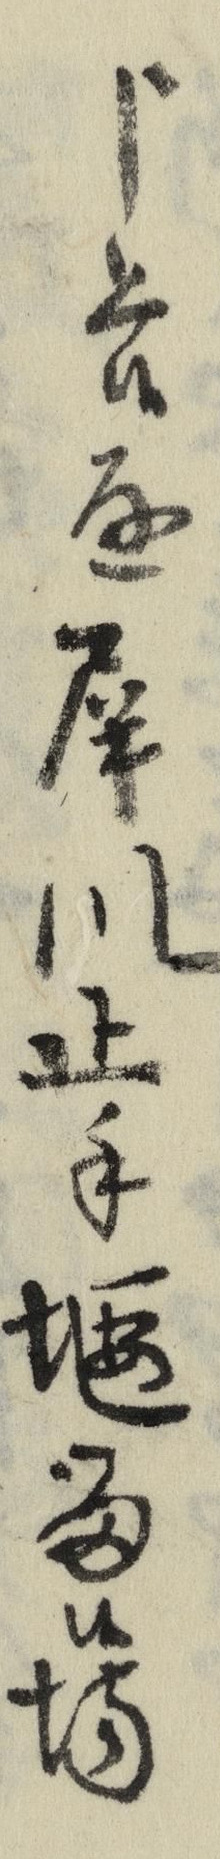申上候通犀川上手堰留候場
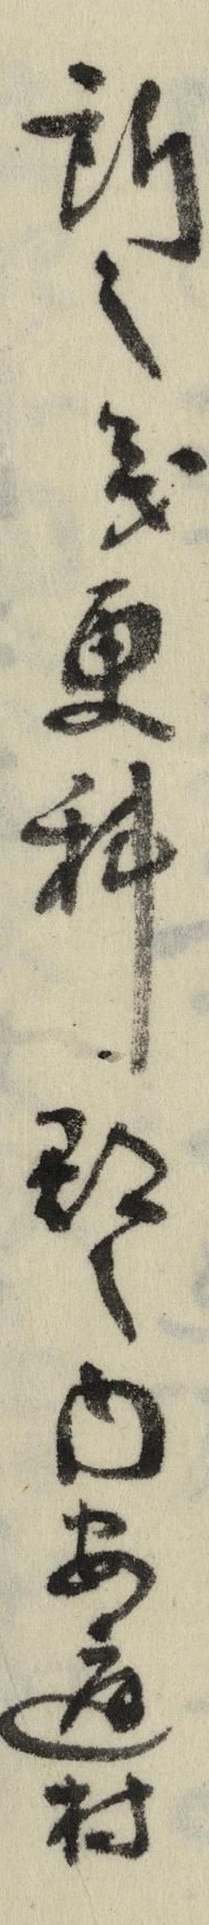所の義更科郡之内安庭村
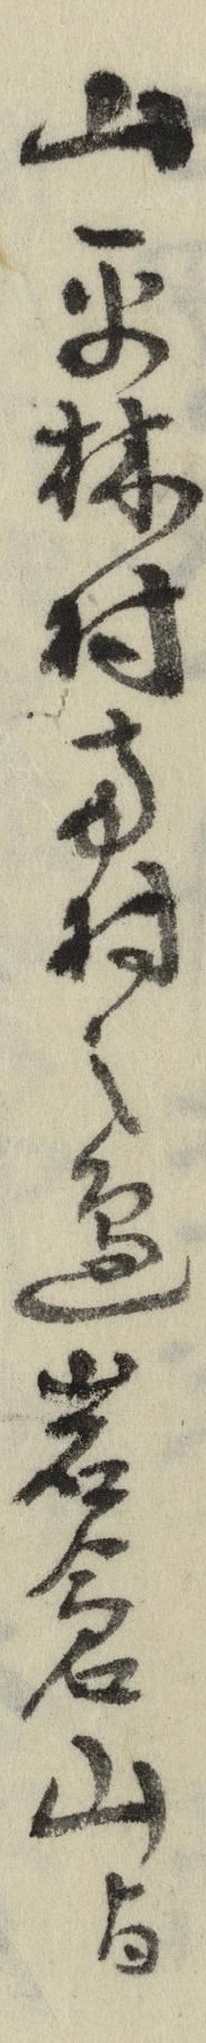山平林両村之辺岩倉山と
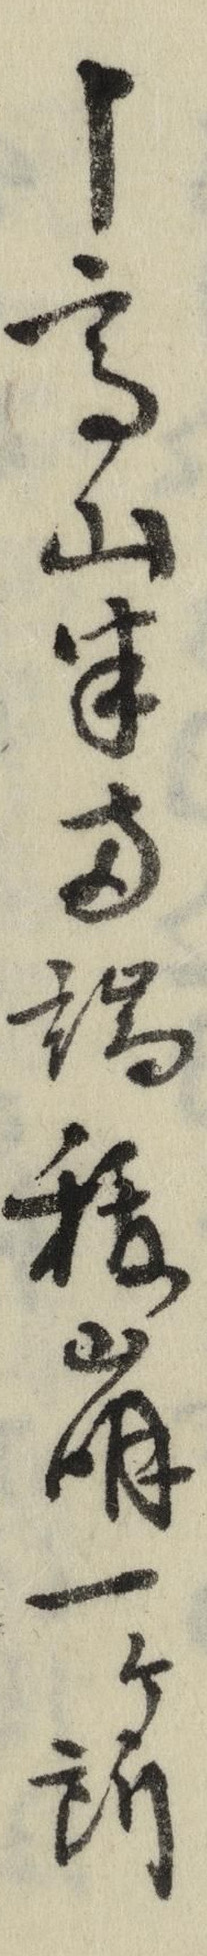申高山半両端抜崩一ヶ所
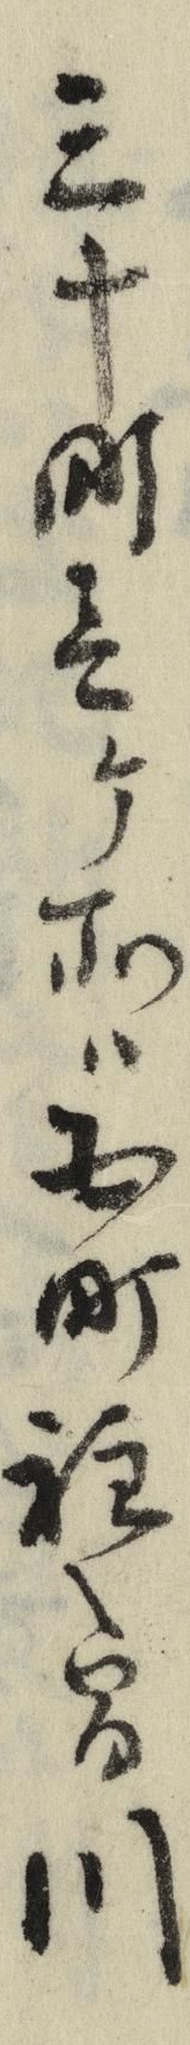三十町壱ヶ所ハ五町程之間川
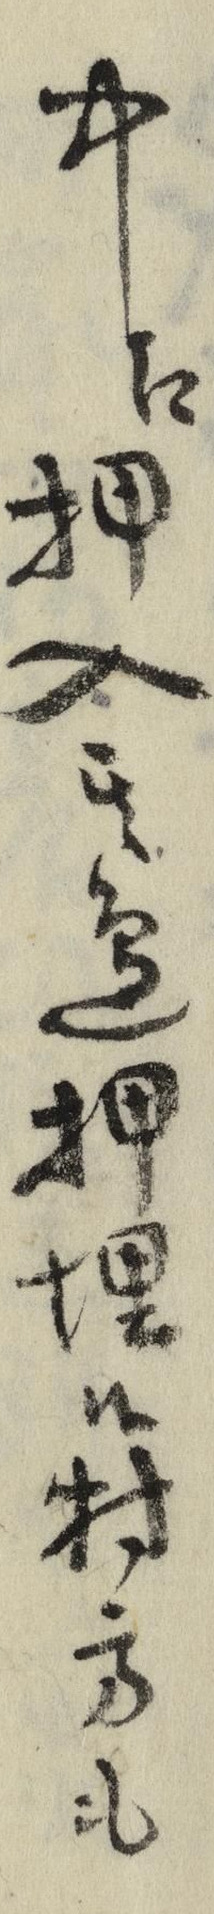中江押入其辺押埋候村方も
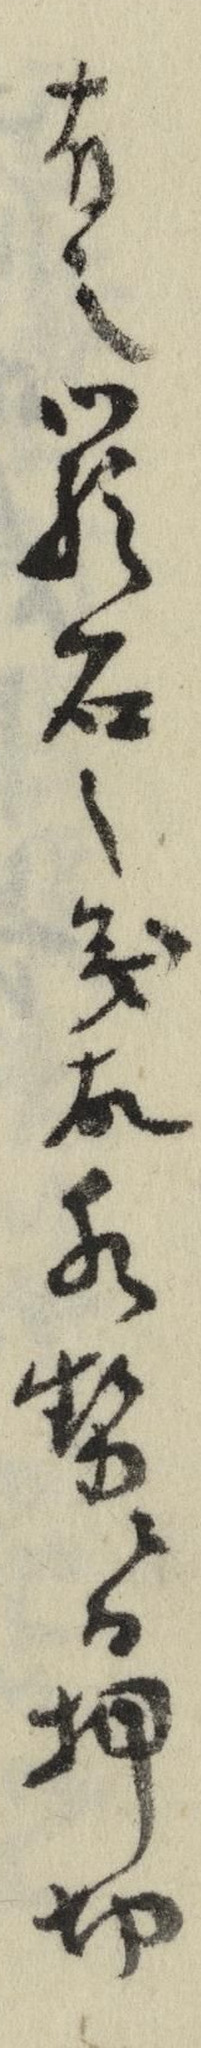有之巌石之儀故水勢二而押切
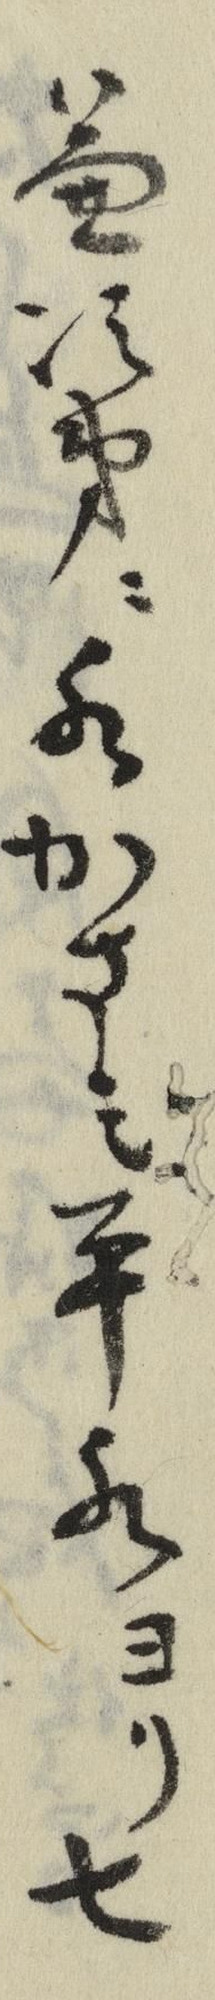兼次第二水かさミ平水ヨリ七
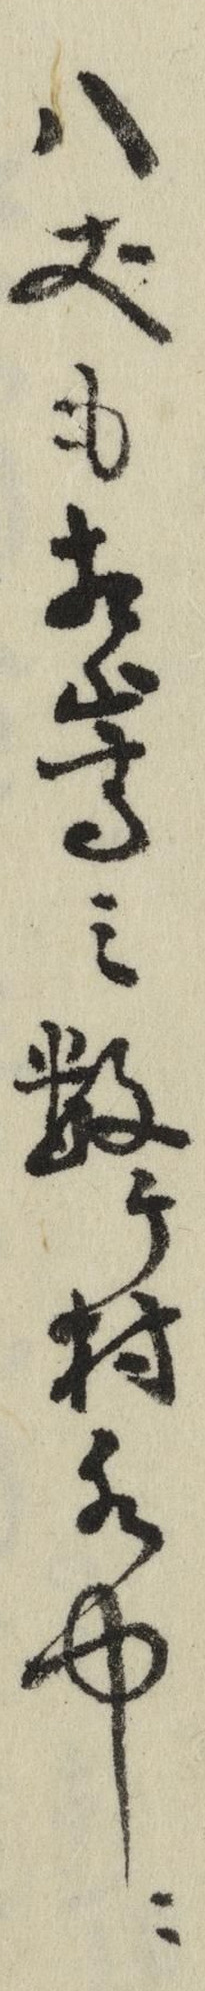八丈も相嵩ミ数ヶ村水中二
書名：信州大地震一件之冩　丁未弘化四年三月吉日
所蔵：東京大学地震研究所図書室 Earthquake Research Institute Library, The University of Tokyo, JAPAN
